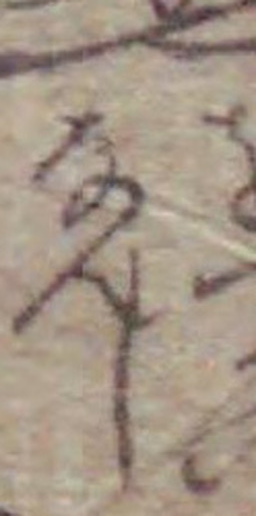なんし
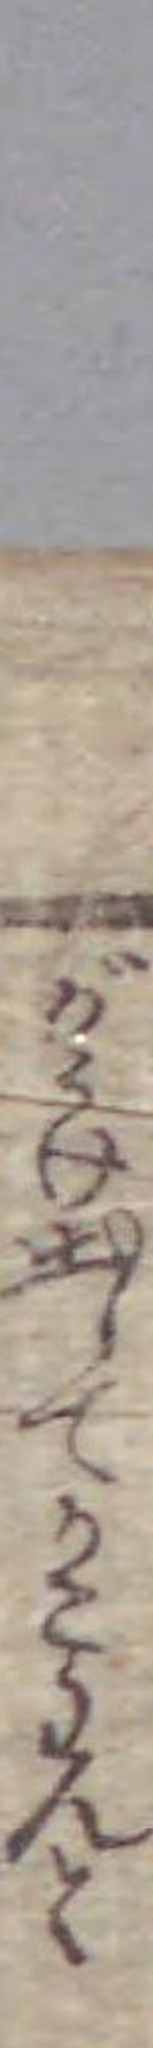がうけ出してかこわんと
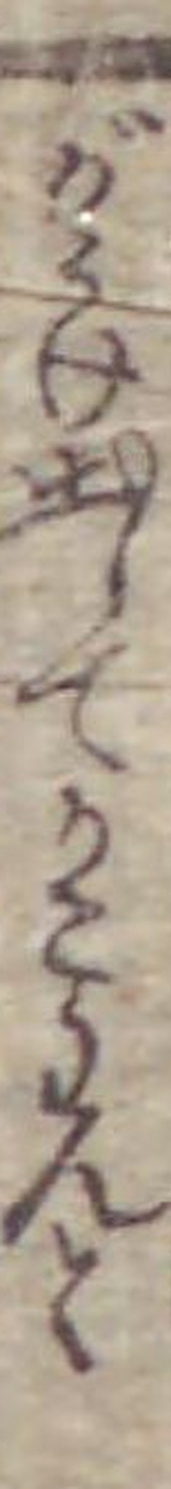がうけ出してかこわんと
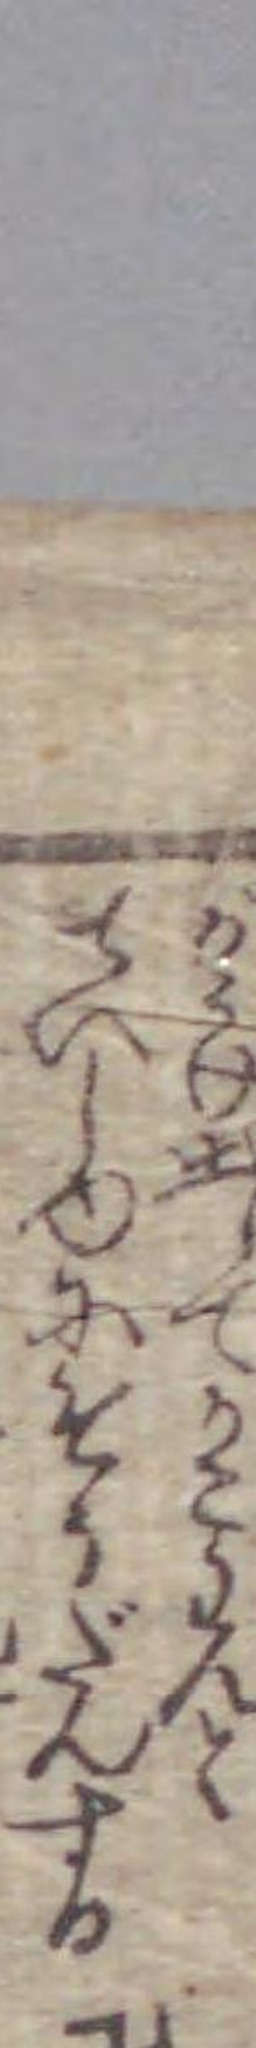ていしゆにそうだんする
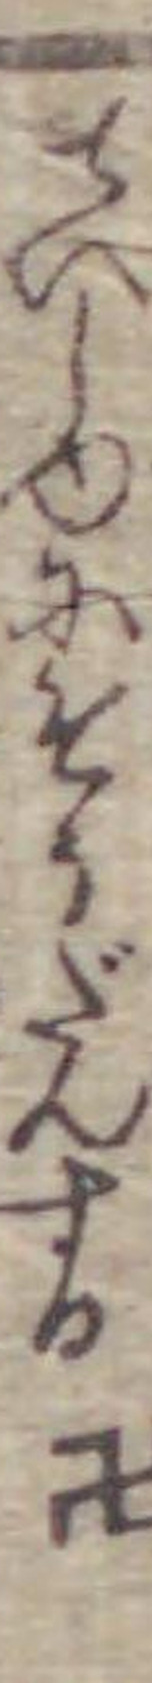ていしゆにそうだんする
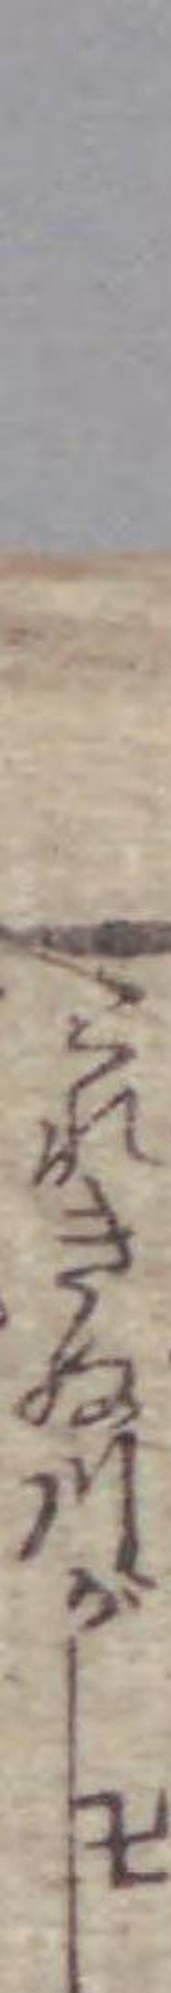これきぬ川が
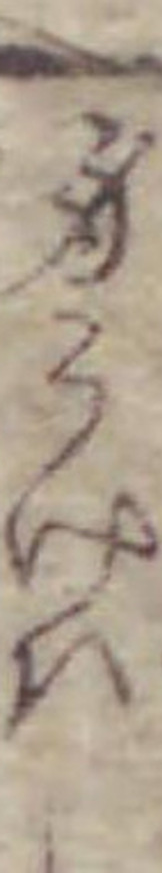身うけは
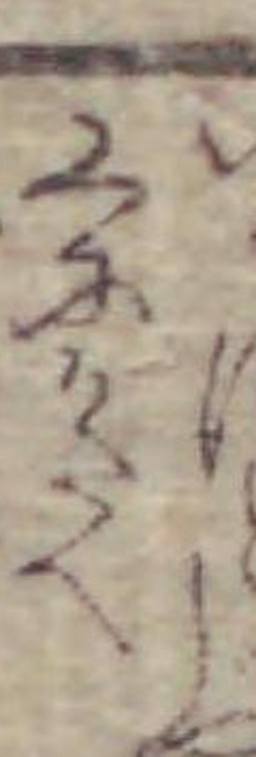くにかたへ
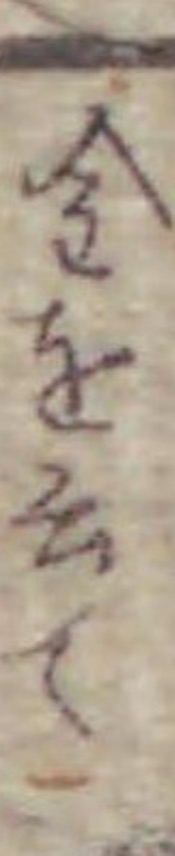金を云て
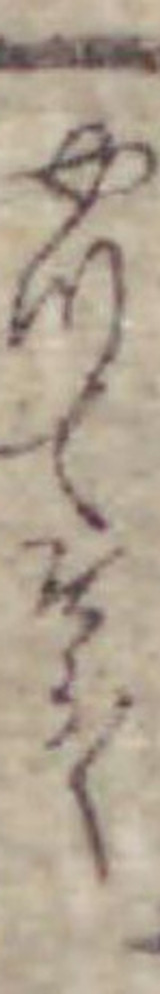やつてそう〳〵
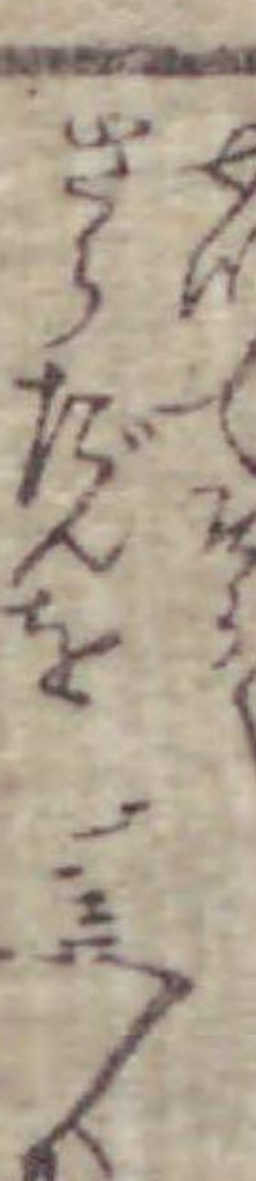さうだんを
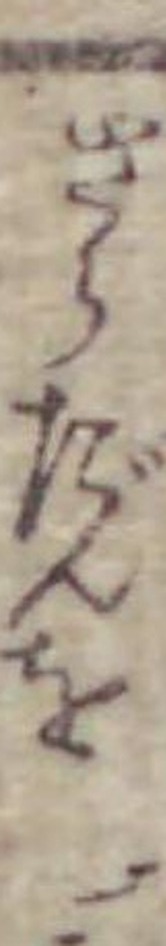さうだんを
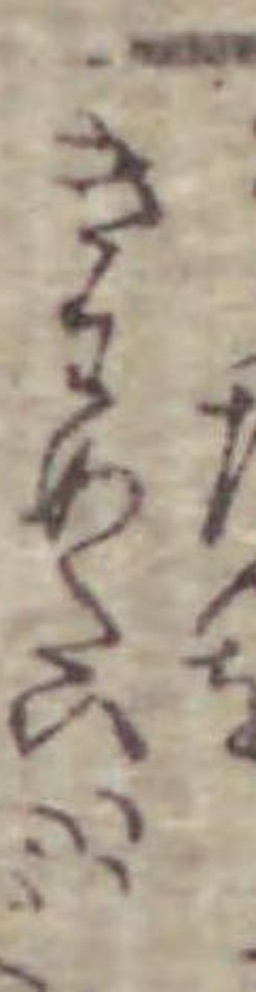きわめたい
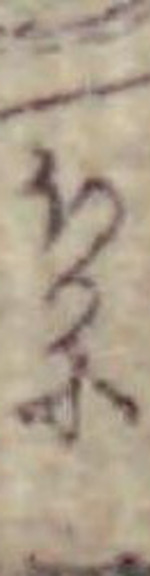ほかに
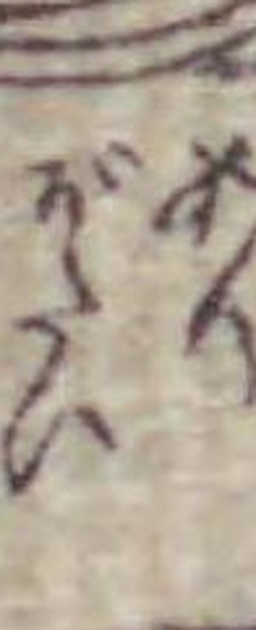がたい
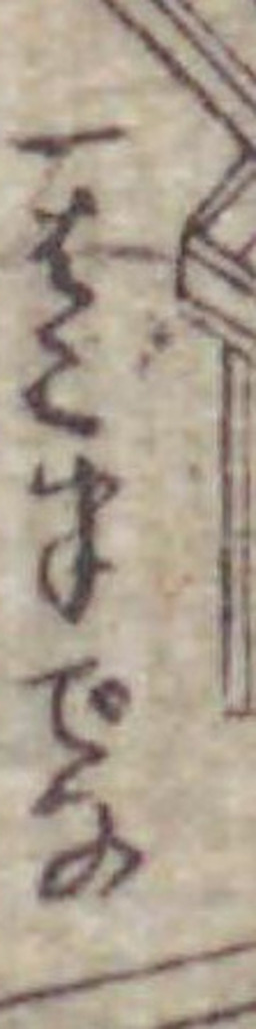一はこ半でな
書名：嗚呼不侭世之助噺 : 3巻
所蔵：国立国会図書館 National Diet Library, JAPAN
